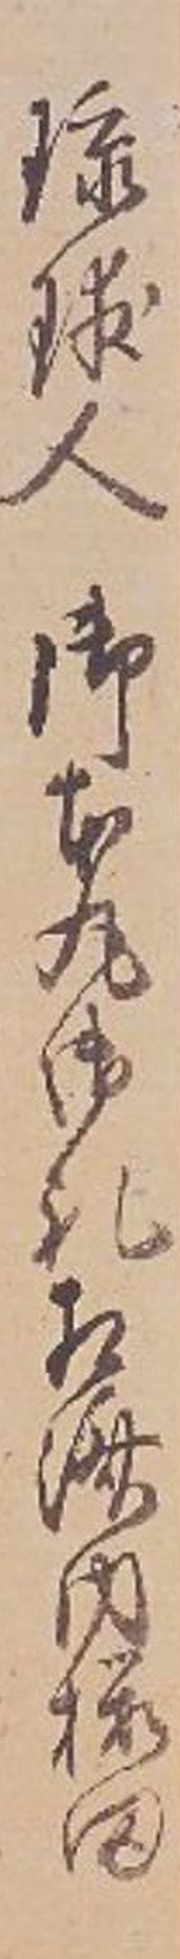琉球人御本丸御礼相済内桜田
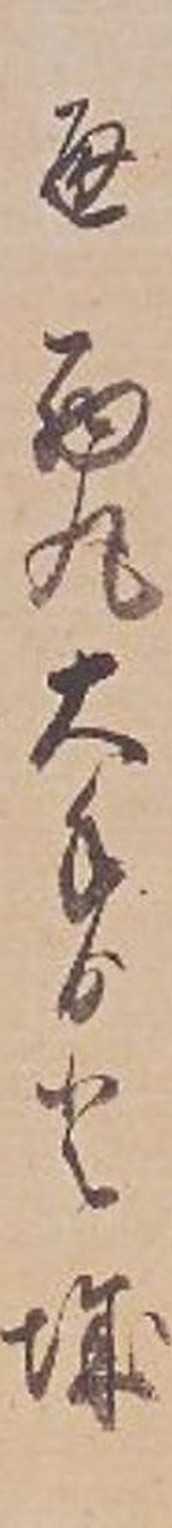通西丸大手ゟ登城
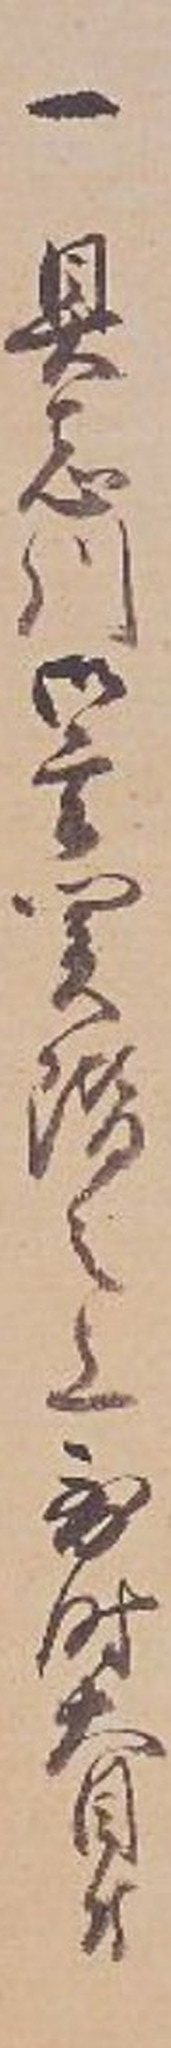一具志川御玄関階之上到時大目付
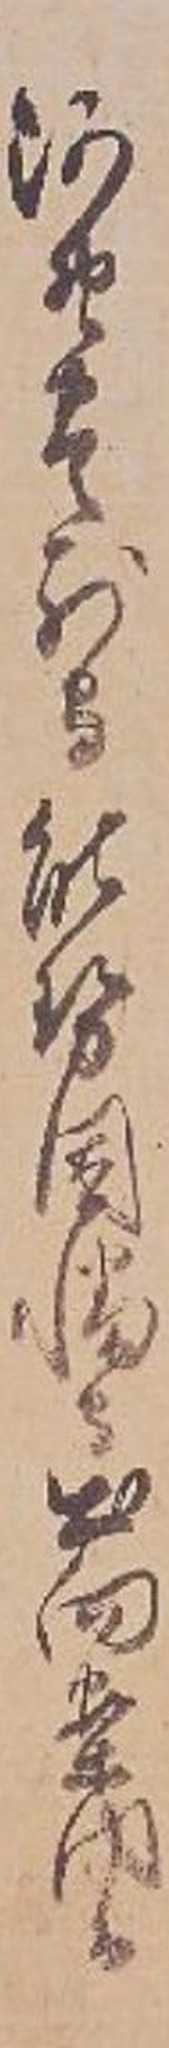河野豊前守能勢因幡守出向案内而
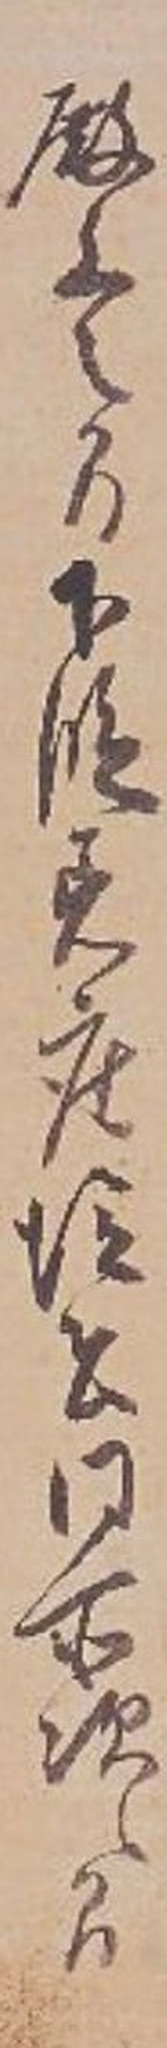殿上之間下段着座従者同所次之間
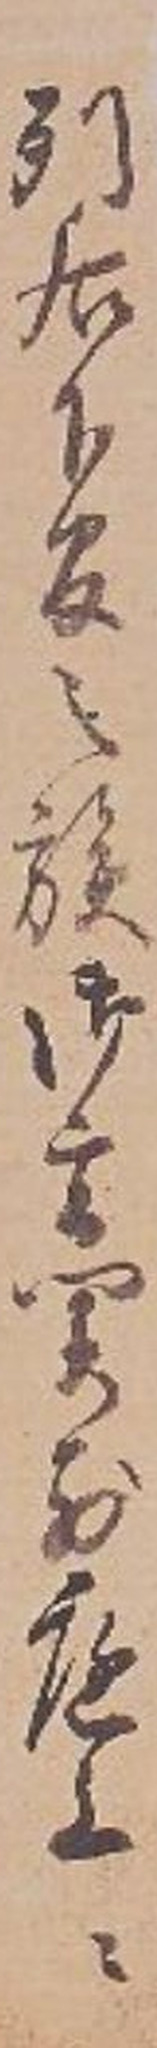列居下官之族御玄関前庭上に

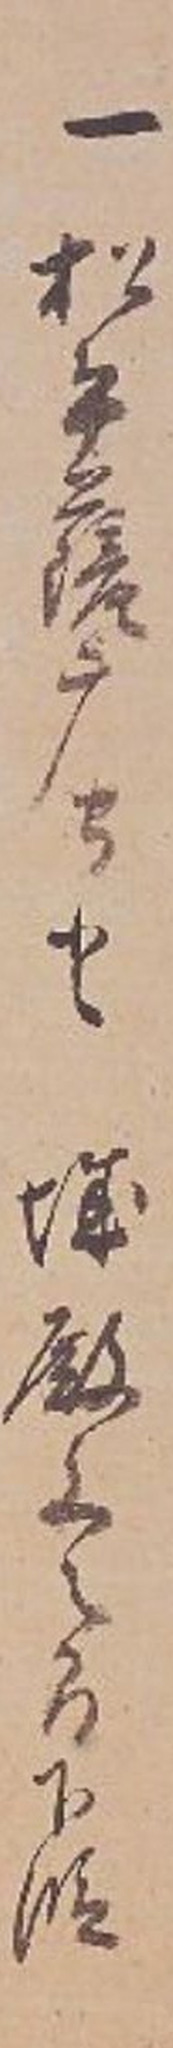一松平薩摩守登城殿上之間下段
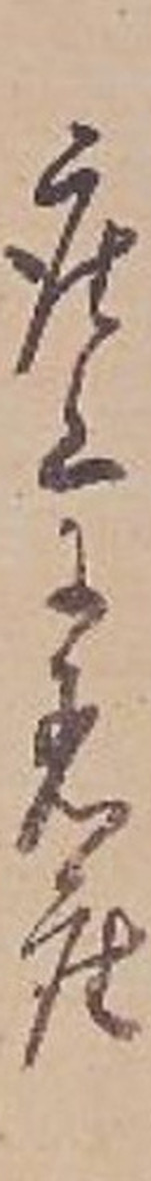座上に着座
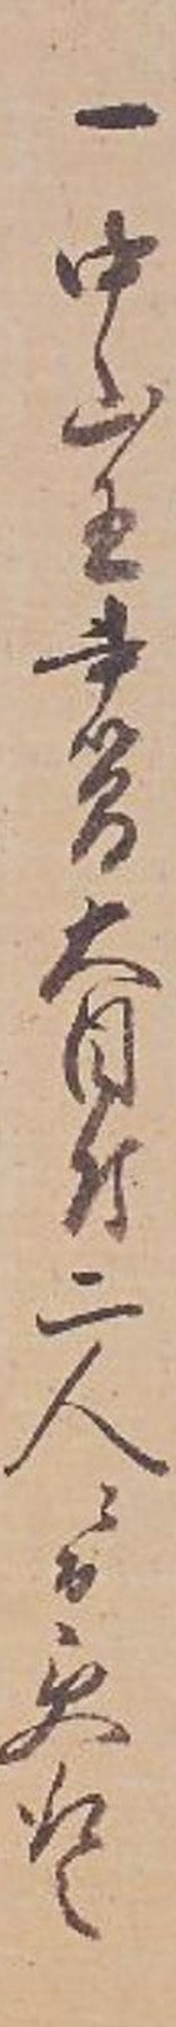一中山王書簡大目付二人に而受取之
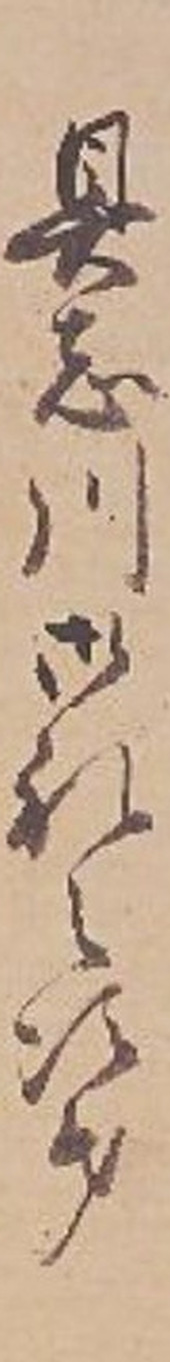具志川御礼之次第
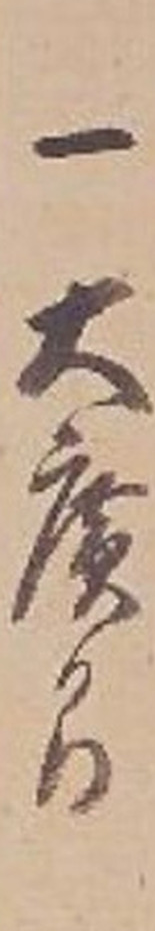一大広間
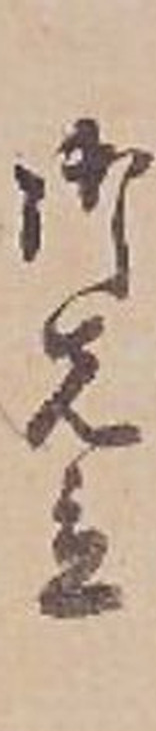御先立
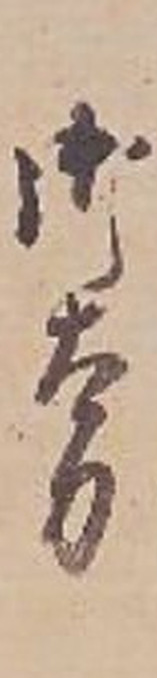御太刀
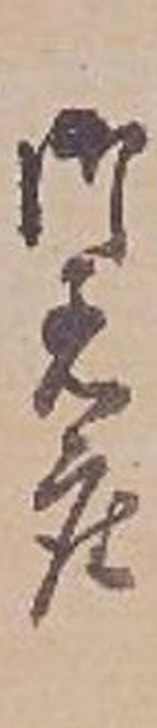御着座

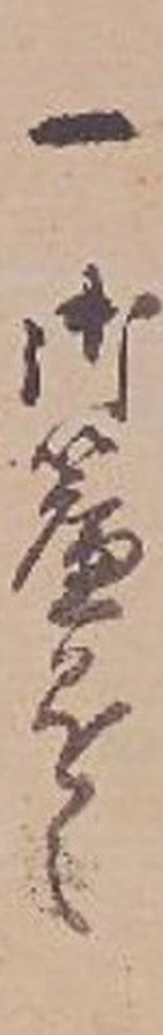一御簾懸之
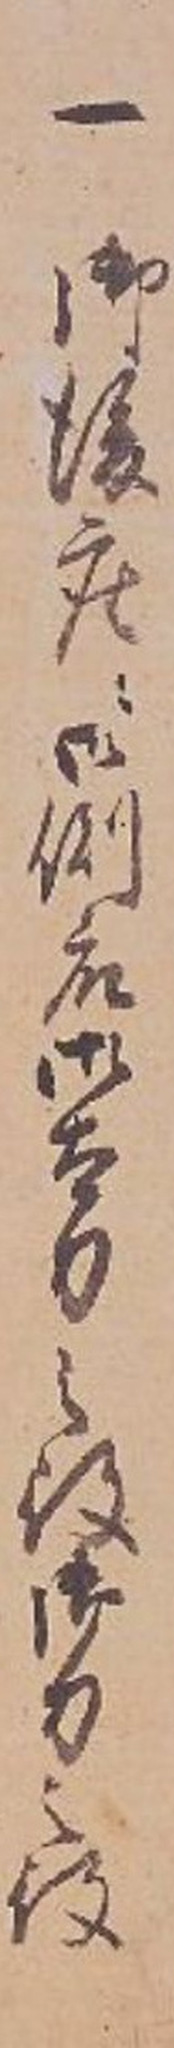一御後座に御側衆御太刀之役御刀之役
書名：琉球人来朝記 五、六、七
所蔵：University of the Ryukyus Library
